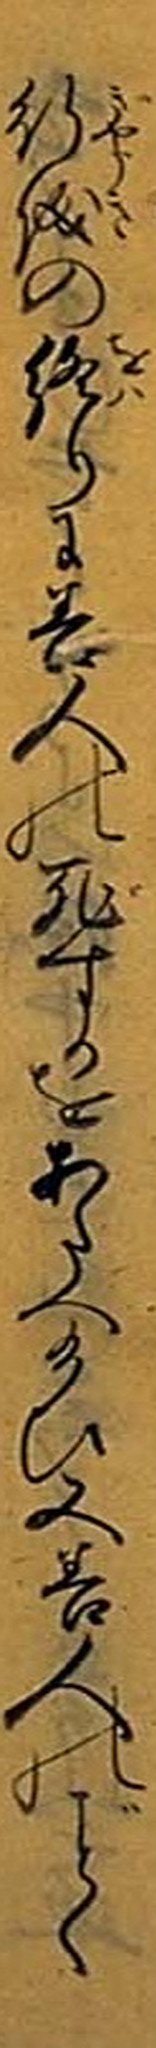行儀の終りに善人の死するをあたへ給ひ又善人のごとく
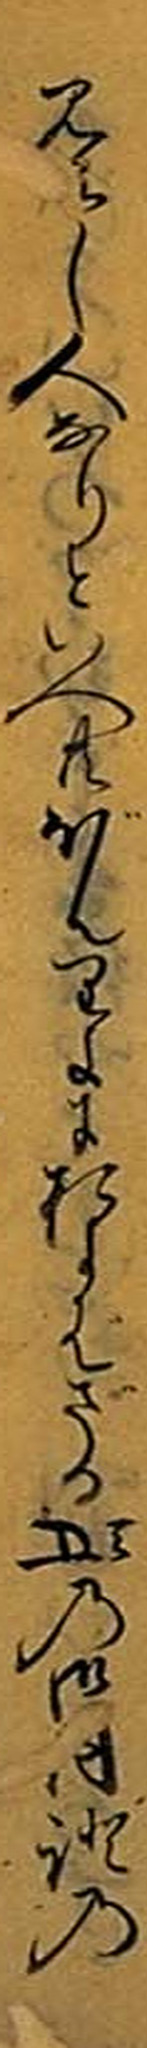見えし人なりといへ共ぼんりよにおよばざるⅮの御内証の
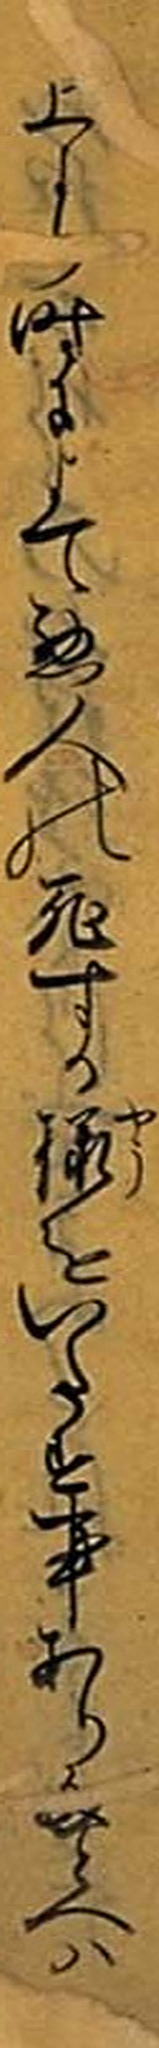上より時によて悪人の死する様をいたす事ありたとへは
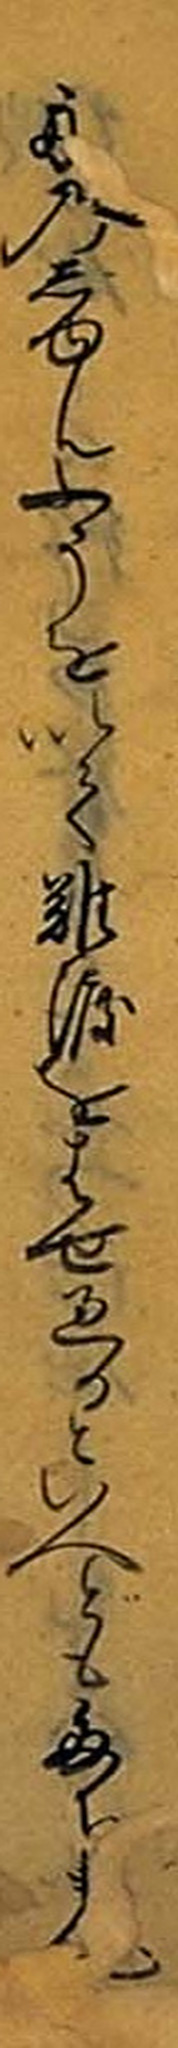舟のしゆんふうを以て難渡をはせ過るといへどもたちま
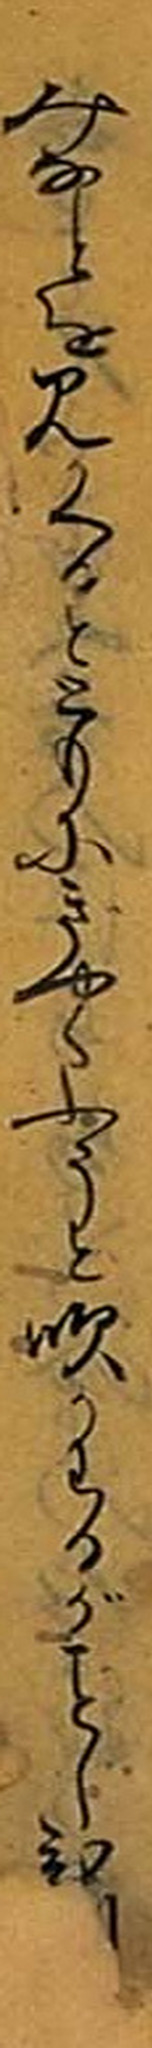みなとを見かくるとともにきやくふうと吹かわるがごとしひ
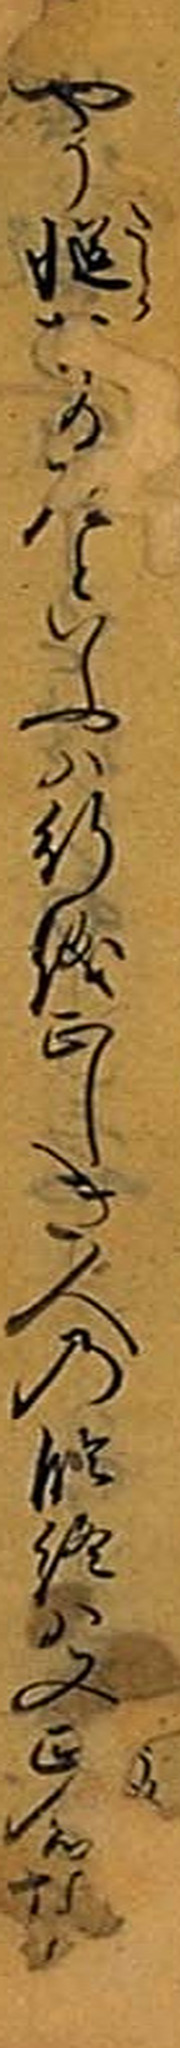やう慥なる道といふは行儀正しき人の臨終は又正な
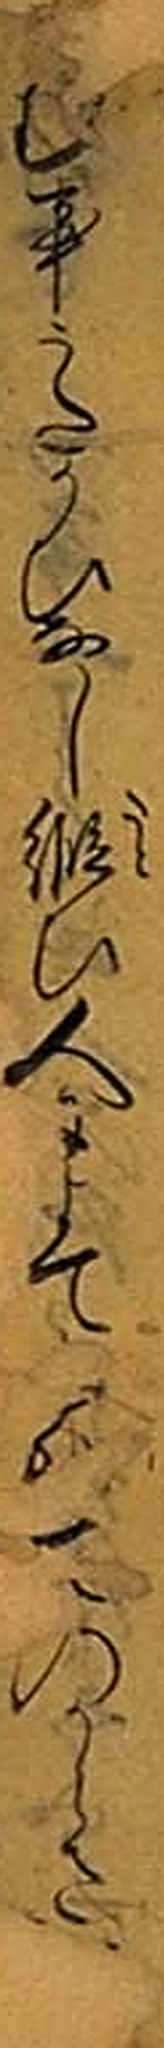む事うたかひなし縦ひ人によててのがらさ
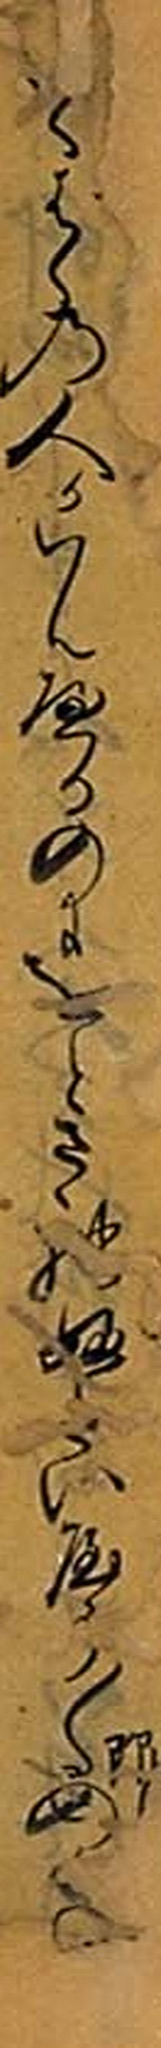くはくの人かいんへるのにをとされふいやう〳〵
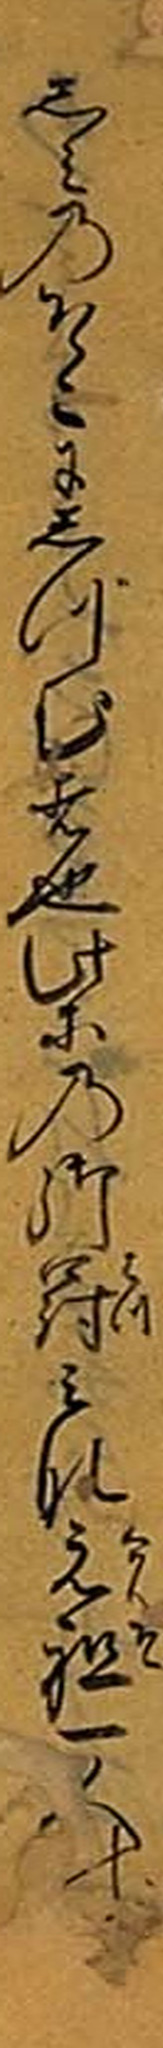しみのそこにしずむ者也此等の御罸みな元祖一人
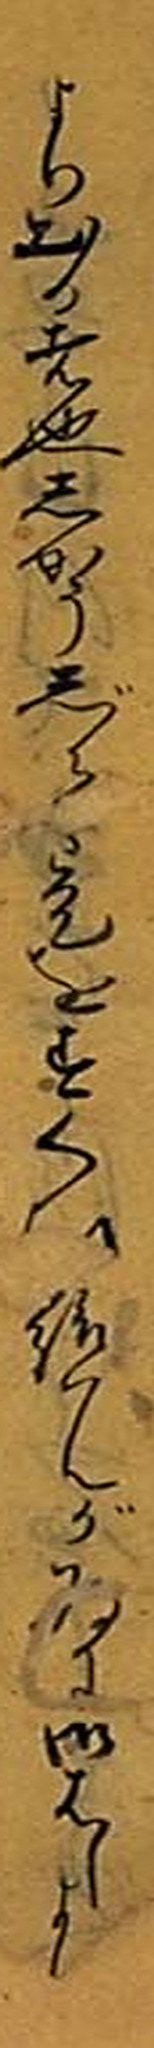より出る者也しかうじら是をすくひ給はんが為に御はしよ
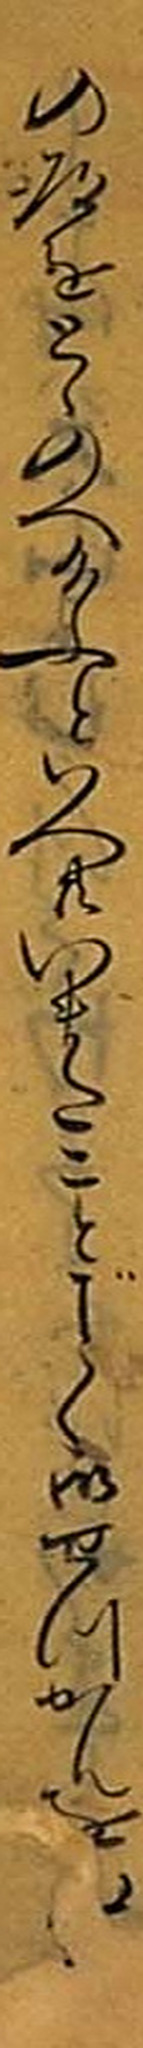の道をとゝのへ給ふといへ共いまたことごとく御せつかんを
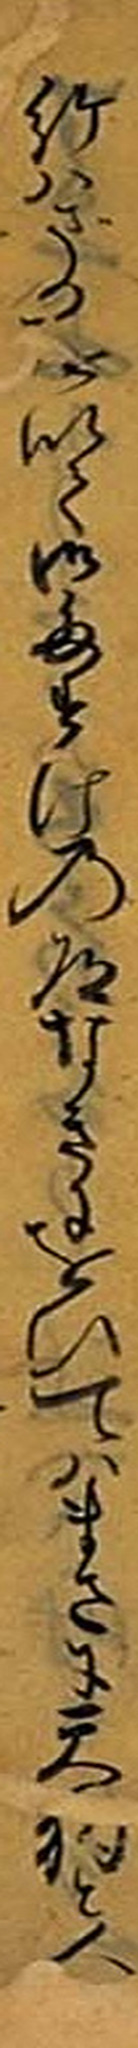行はざるを以て御たすけの道なきにをひてはまさに天狗と人
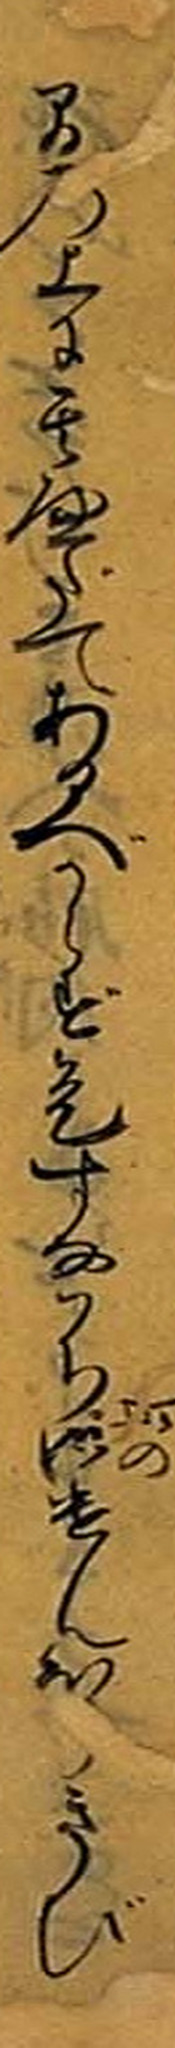間の上に其へだてあるべからず是すなはち御けんほきび
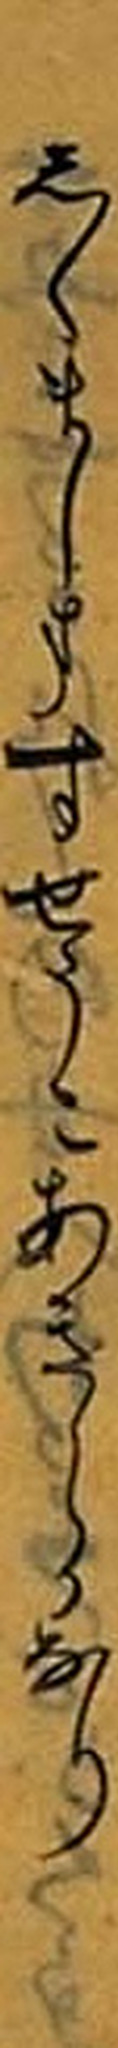しくましますせうこあきらかなり
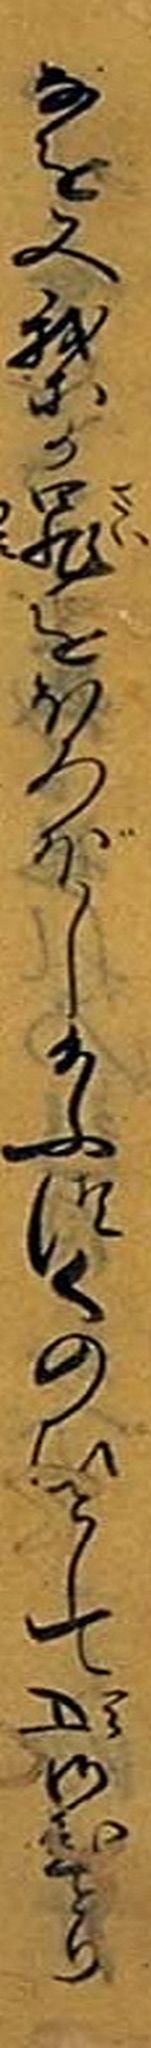なを又我等か罪をほろぼし給ふつくのひとしてⅮ御ひとり
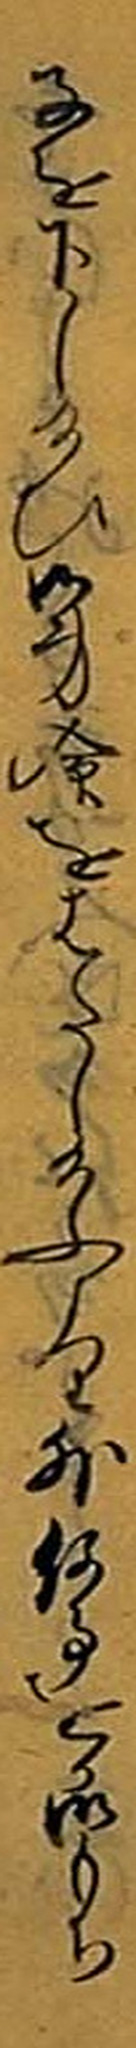子を下し給ひ御身命をはたし給ふより外何事をか御もち
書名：ぎやどぺかどる
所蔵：東京大学総合図書館 / General Library in the University of Tokyo
